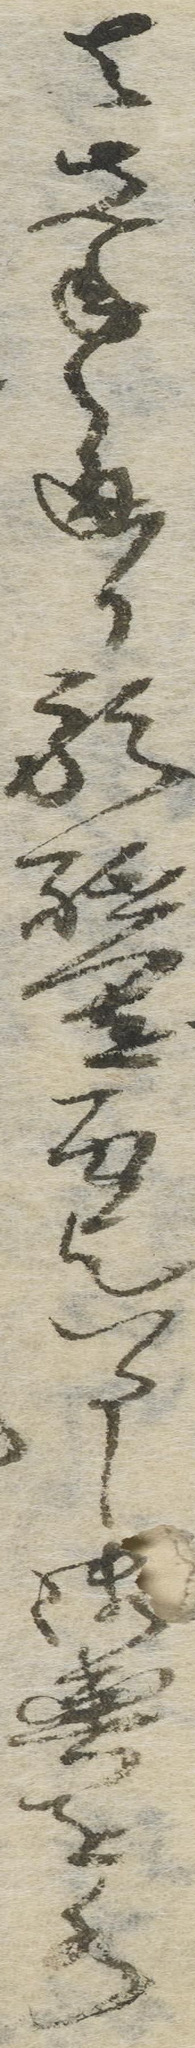は先年通り於稲里雨乞いたし御輿を水
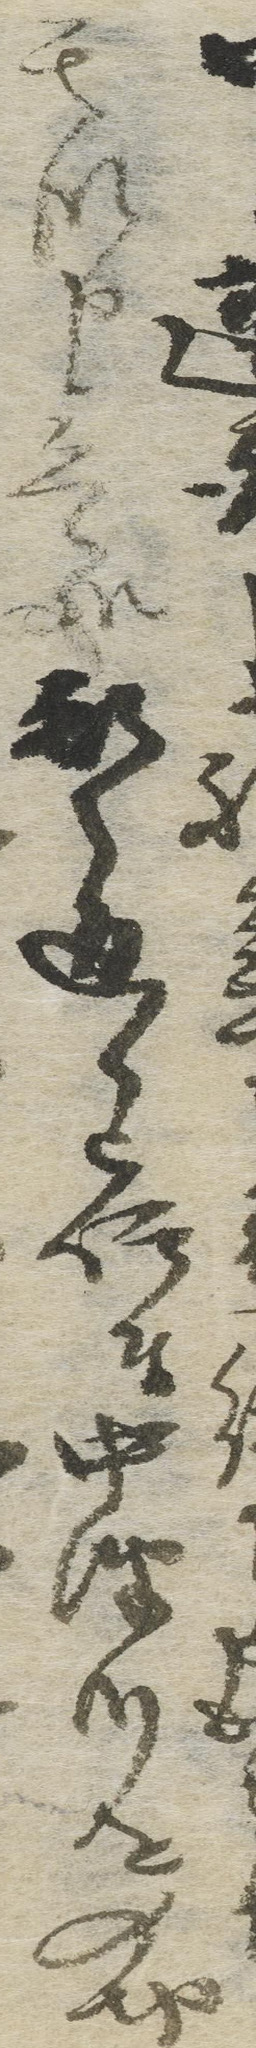其段申上候処願之通り被仰付中沢川を〆切
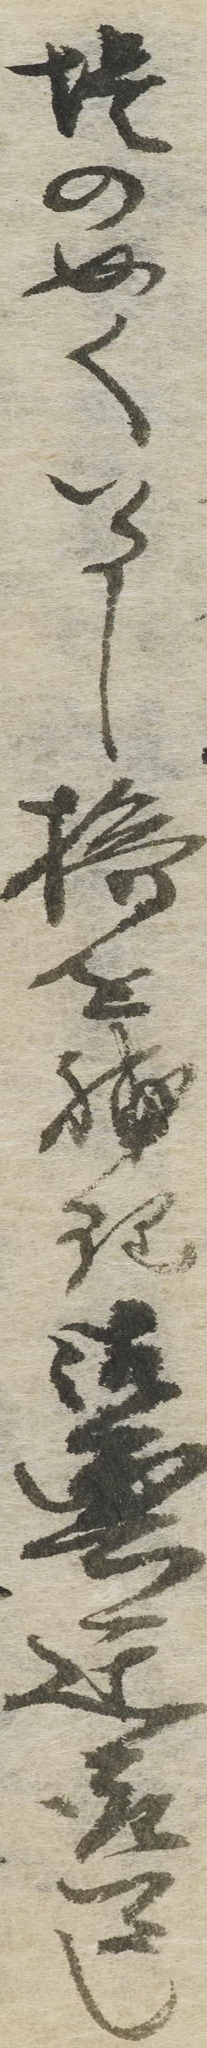堤の如くいたし櫓をほり御輿遷座いたし
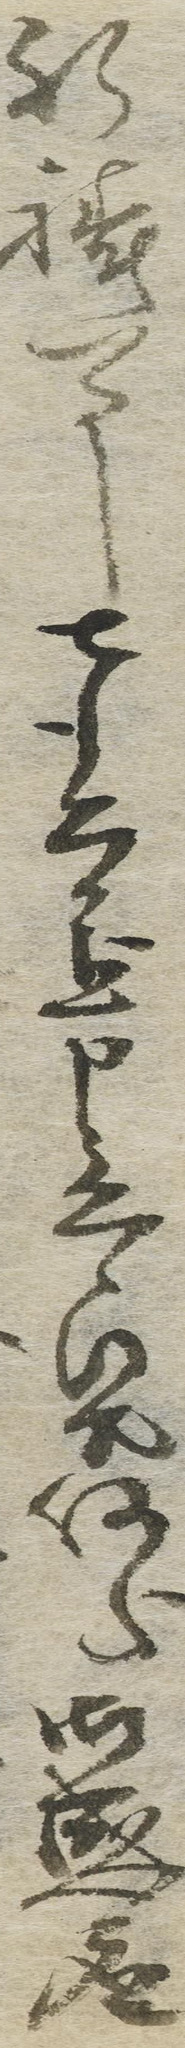祈祷いたし七月二日迄申立候得共何分御感応
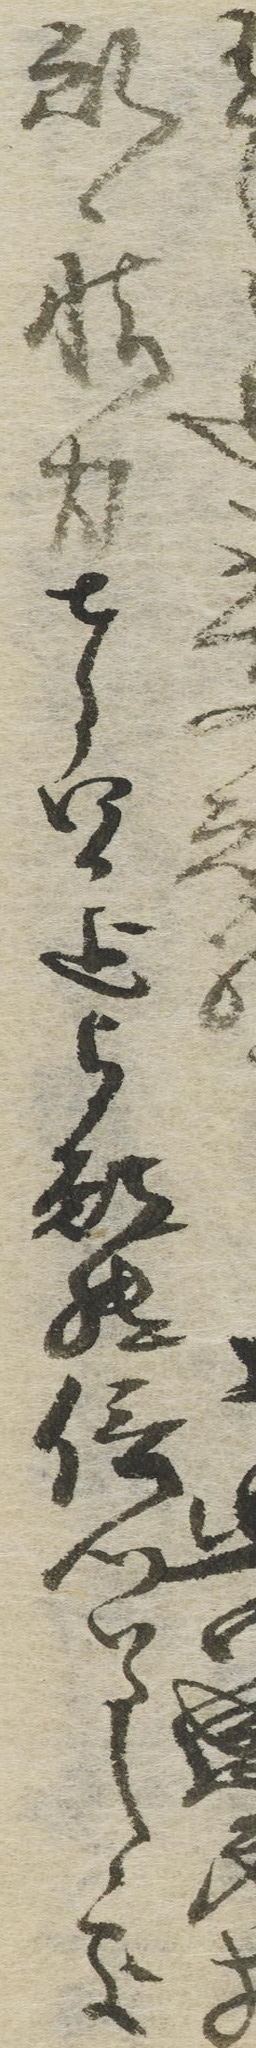願候慎力七月四日迄被願継信心いたし候処

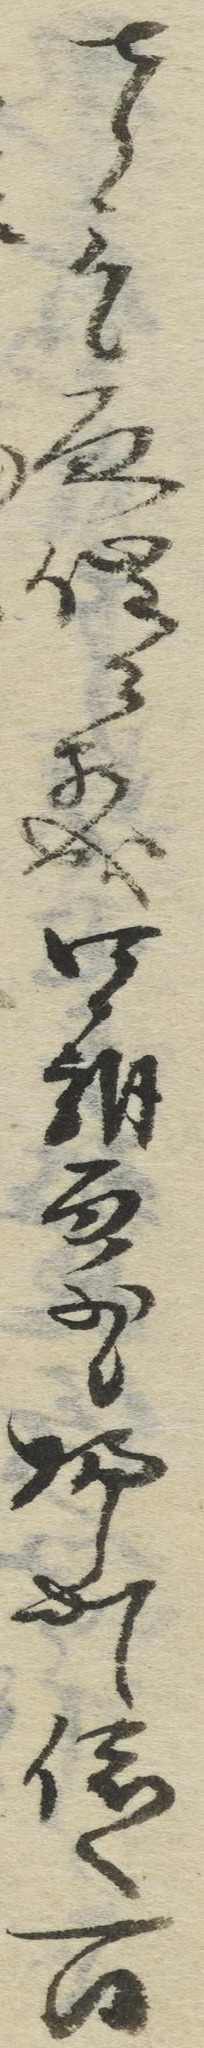七月三日雨催二相成四日朝雨少しふり出し依之一同
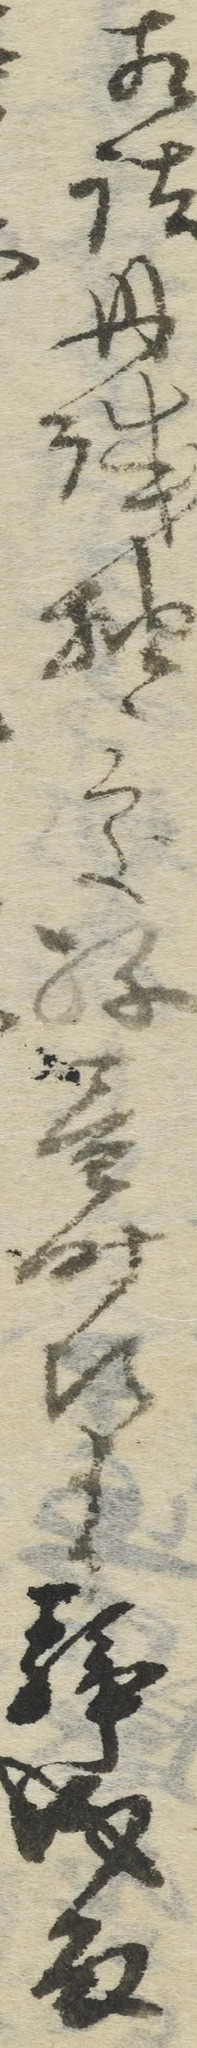相談丹誠抽候処弥暮時頃より静成雨
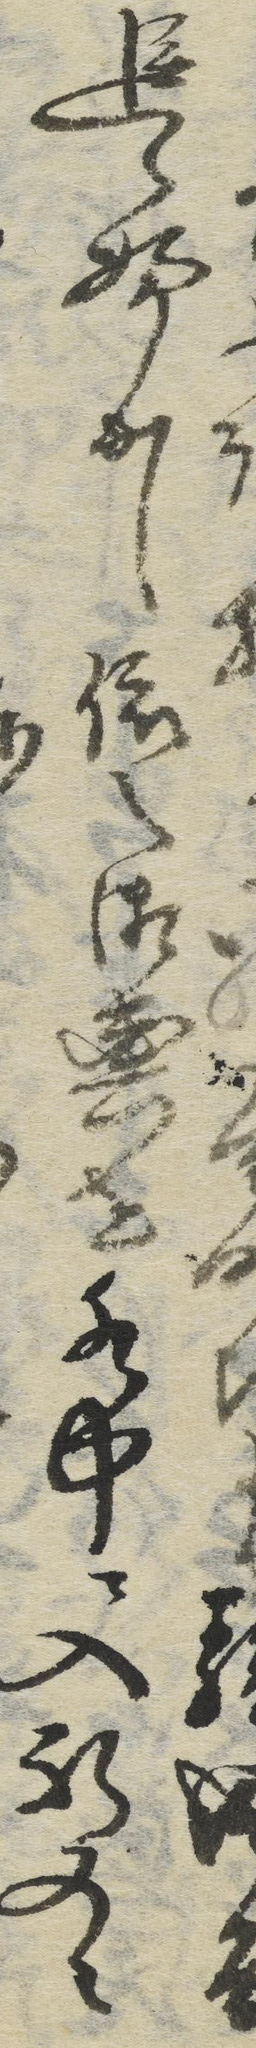追々ふり出し依之御輿を水中二入祈又々
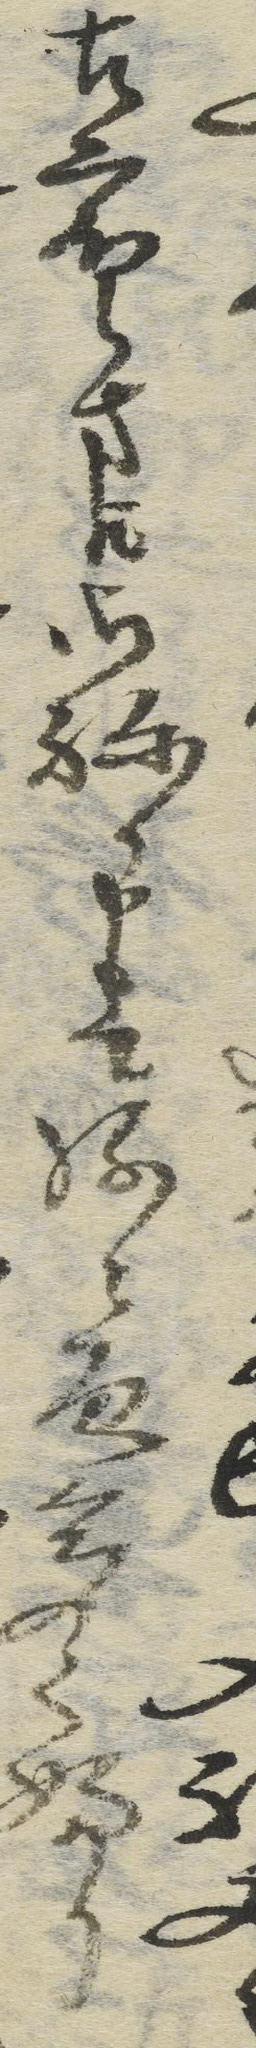右宿之方江御ねり申上候弥々雨多くふり
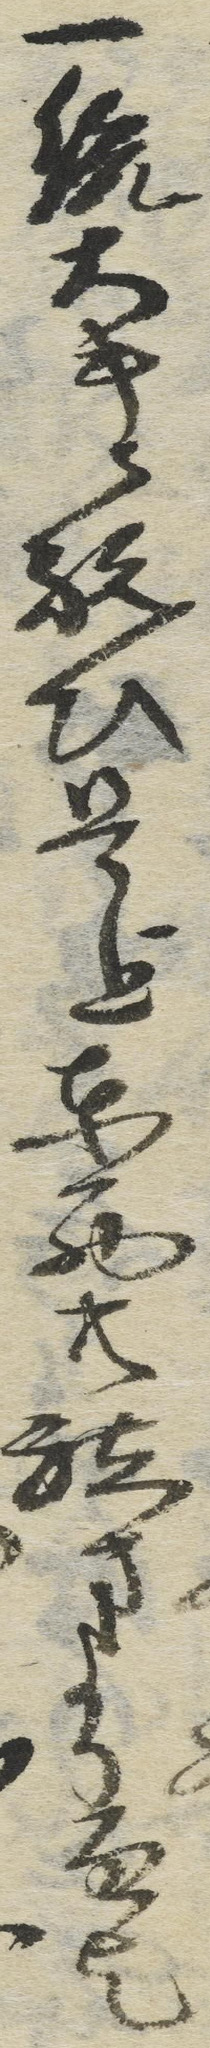一統大キ二祝ひ是迄東西共諸方より雨乞
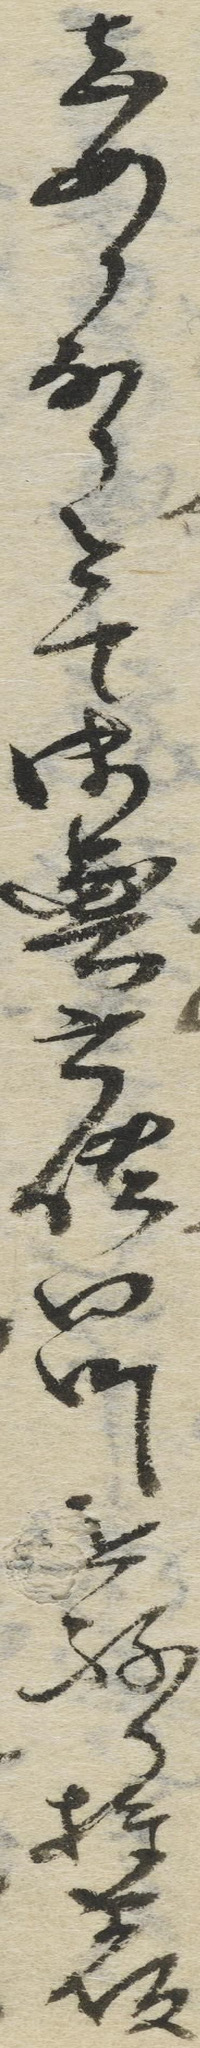しめりなりとて御輿六供田町上ねり持平坂
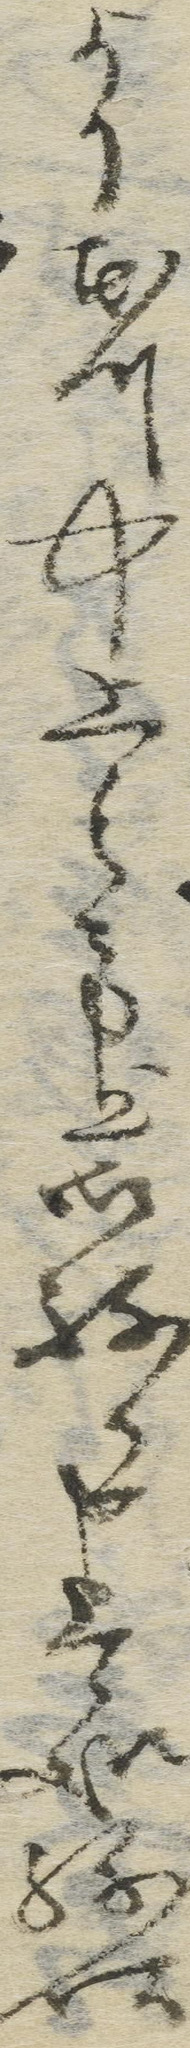より本町中上之方迄御ねり申上候処弥以
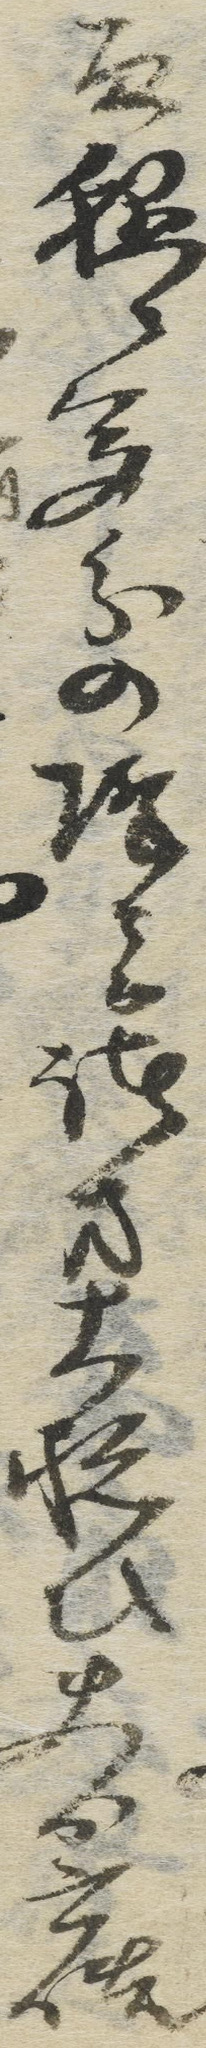雨猛二多分之降二而諸方大悦ひ夫ゟ六供
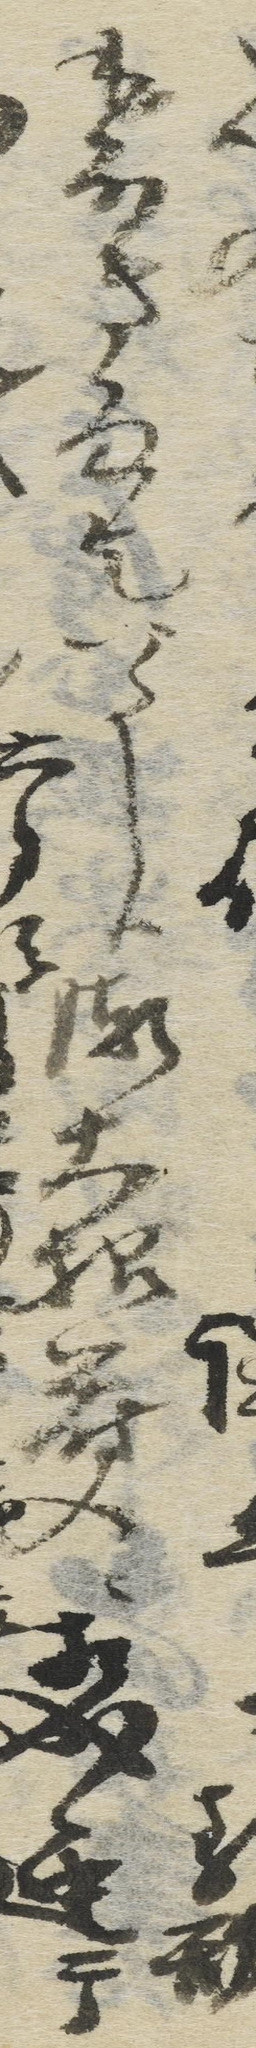もなき雨乞いたし候漸大根荷入二相成候迚テ
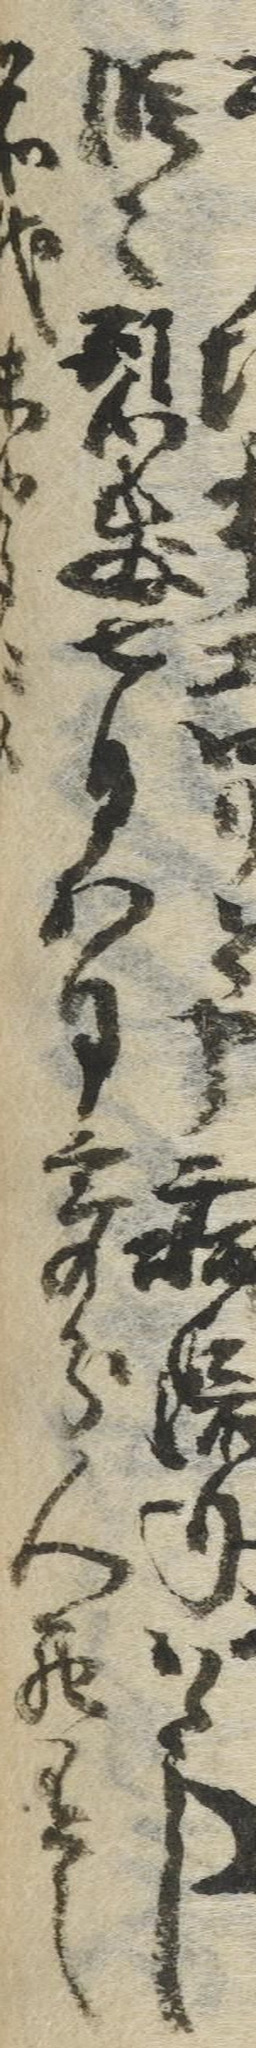段々烈敷七月八月多分人死有之
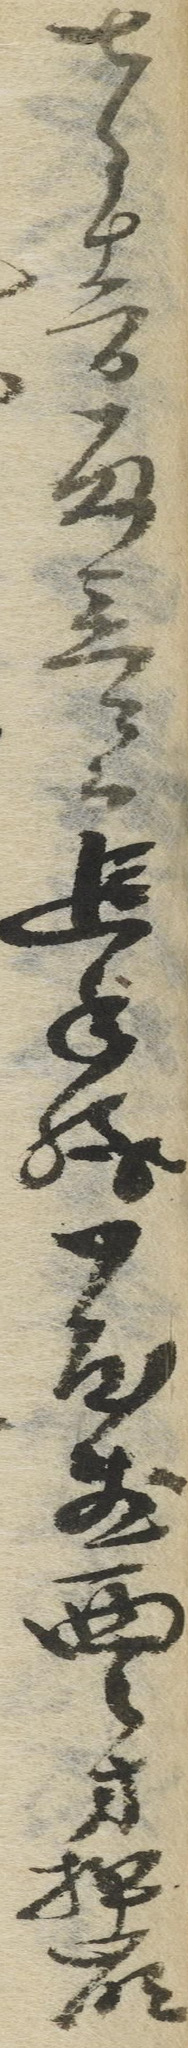七月十二日雨立二而追手様御屋敷西之方押崩
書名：信濃越後　地震書留
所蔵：東京大学地震研究所図書室 Earthquake Research Institute Library, The University of Tokyo, JAPAN
